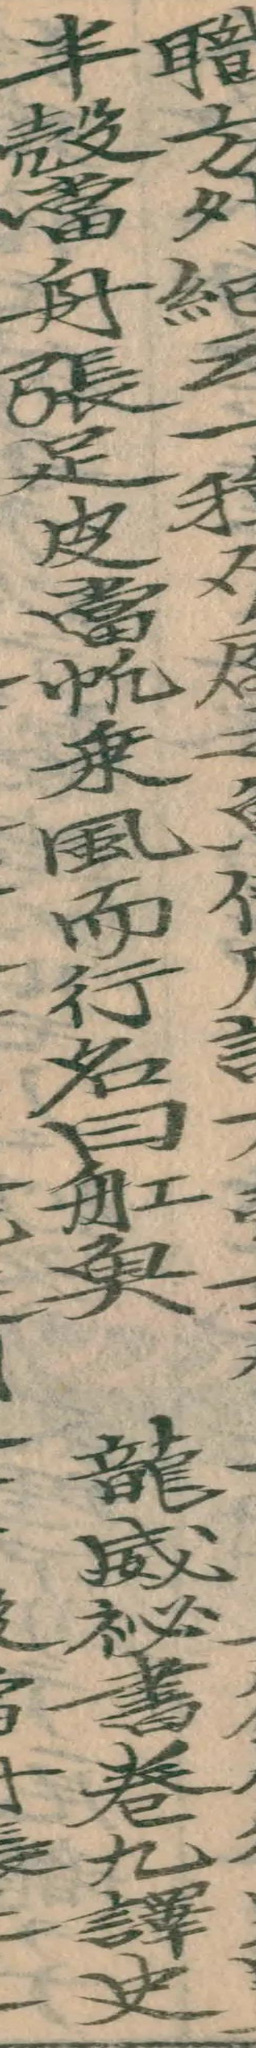半殻當舟張足皮當㠶乗風而行名曰舡魚龍威秘書巻九譯史
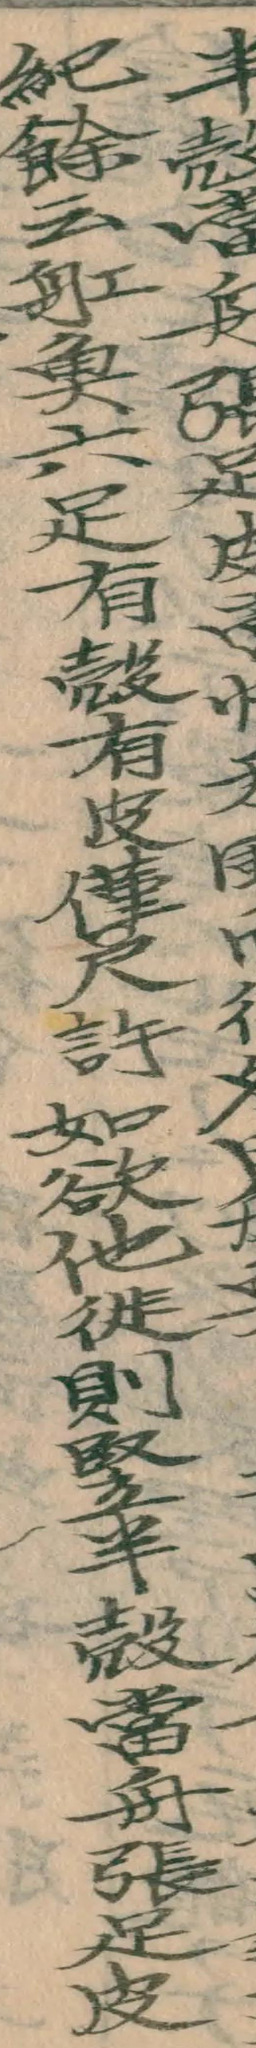紀餘云舡魚六足有殻有皮僅尺許如欲他徙則竪半殻當舟張足皮
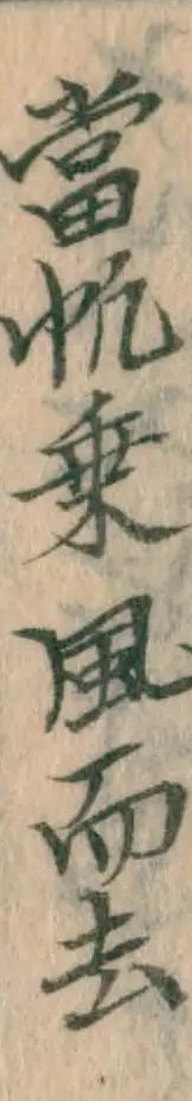當㠶乗風而去

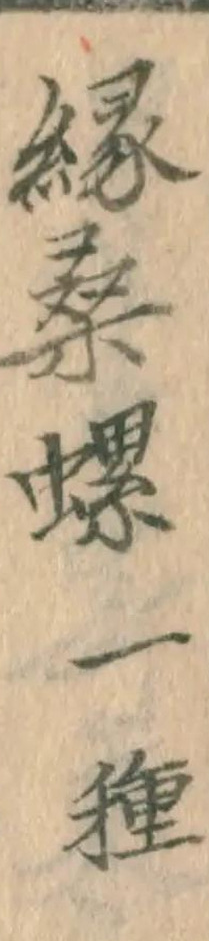緑桑螺一種
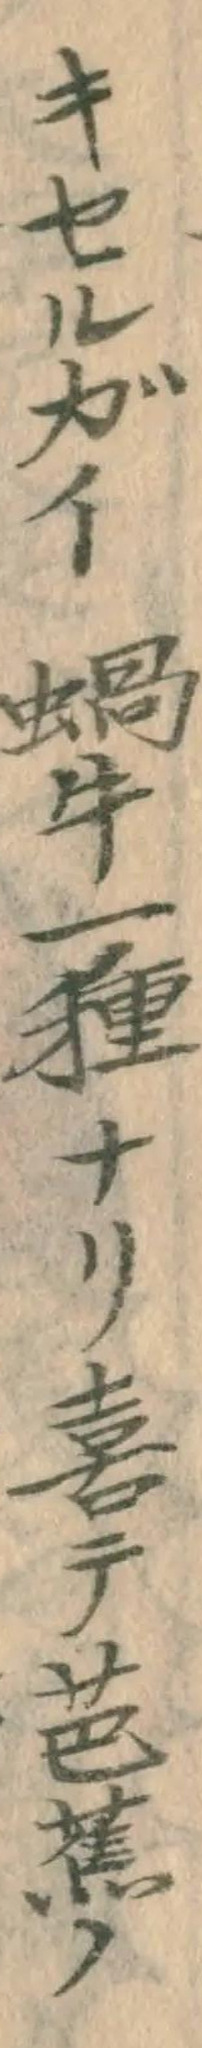キセルガイ蝸牛一種ナリ喜テ芭蕉ノ
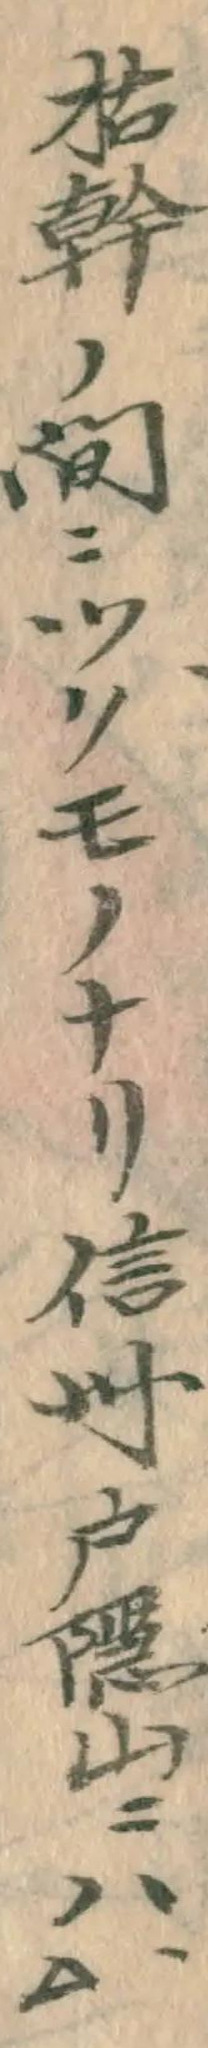枯幹ノ間ニツクモノナリ信州戸隠山ニハ
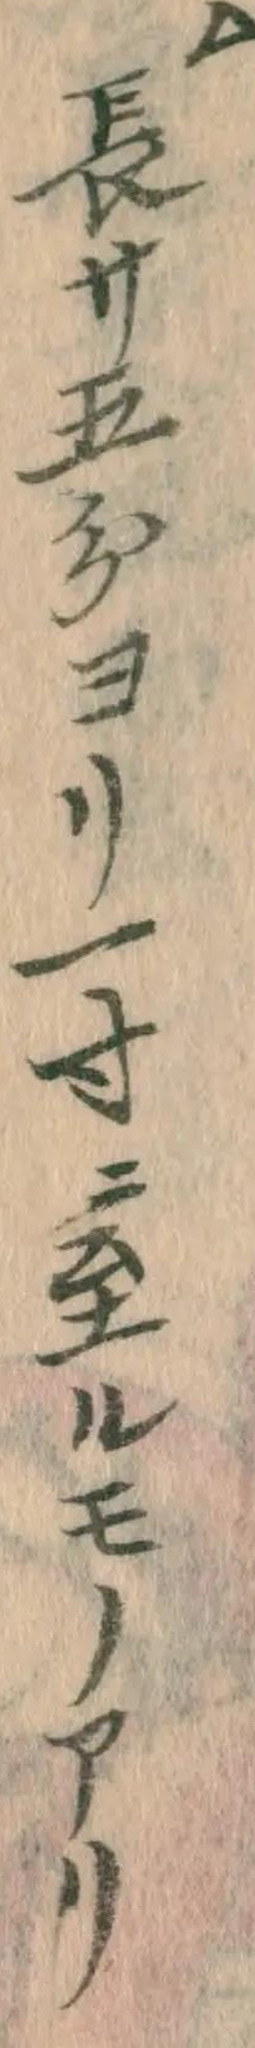長サ五分ヨリ一寸ニ至ルモノアリ
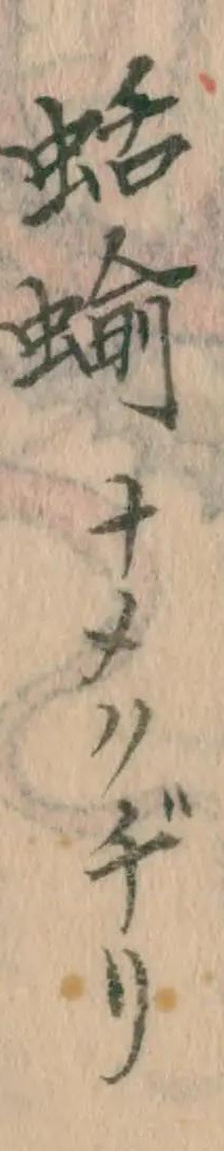蛞蝓ナメクジリ
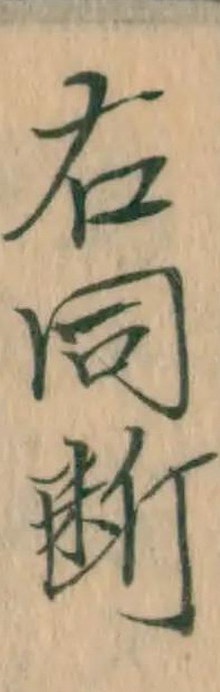右同断

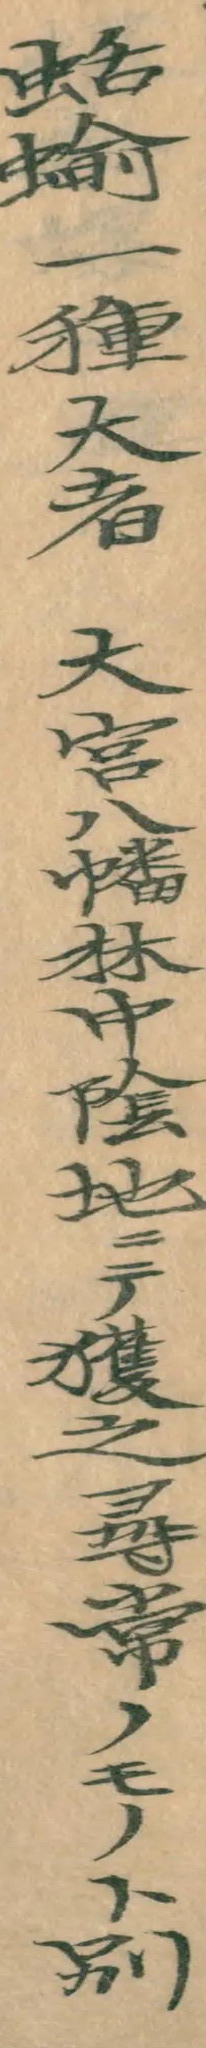蛞蝓一種大者大宮八幡林中陰地ニテ獲之尋常ノモノト別

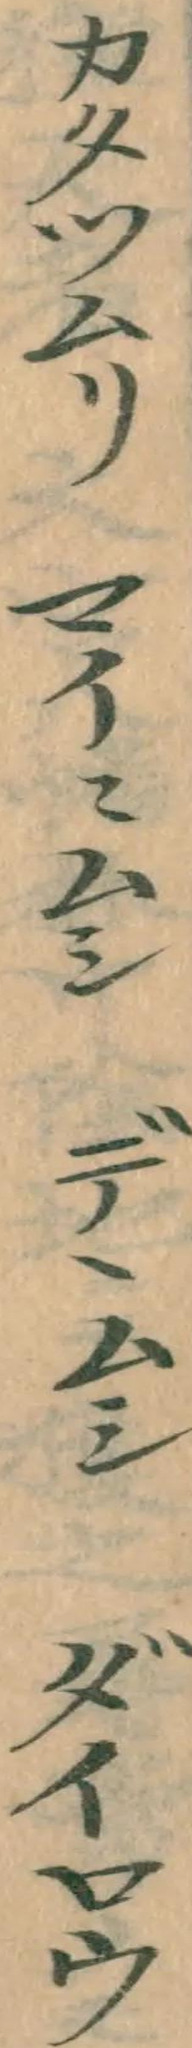蝸牛カタツムリマイ々ムシデヽムシダイロウ
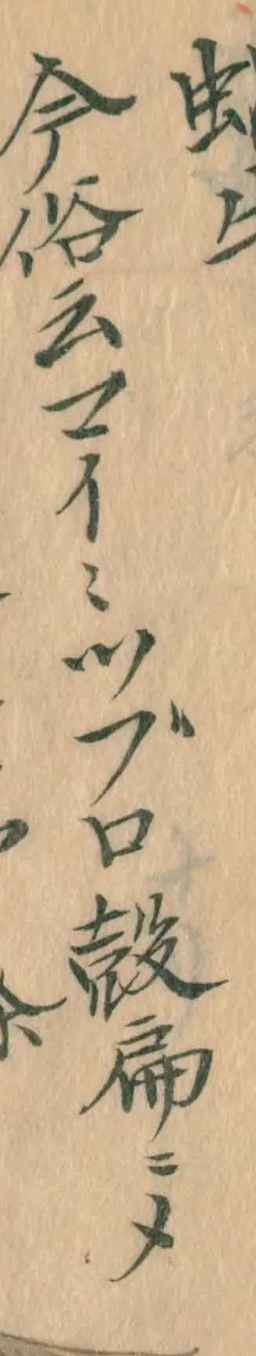今俗云マイ々ツブロ殻扁ニシテ
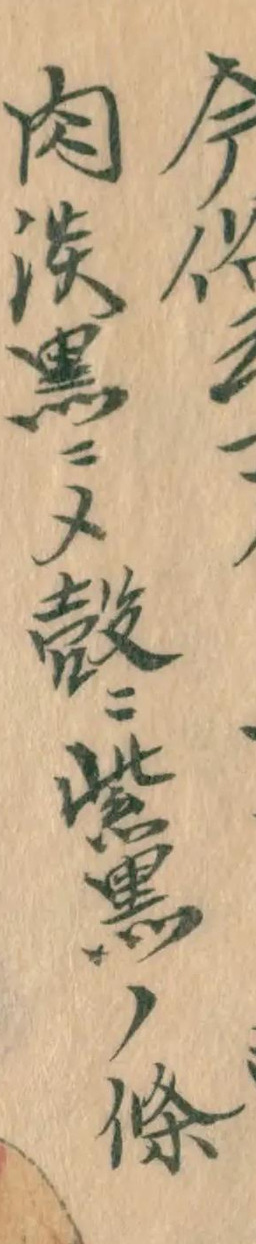肉淡黒ニシテ殻ニ紫黒ノ條
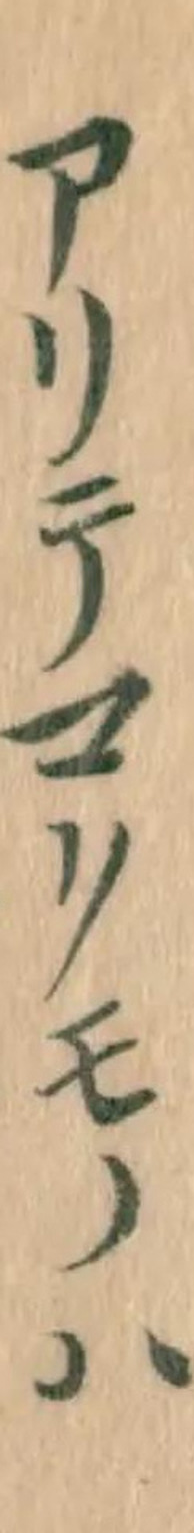アリテマクモノハ
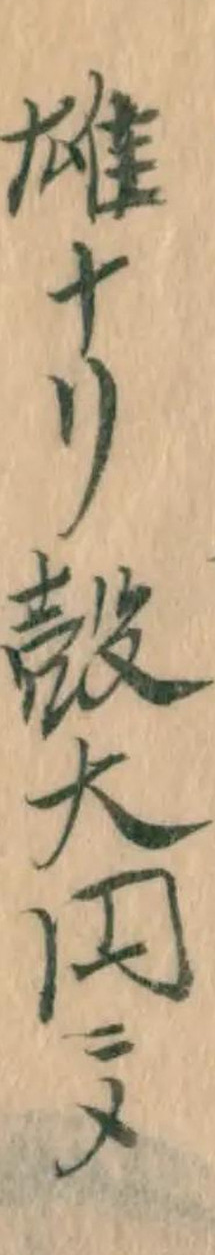雄ナリ殻大円ニシテ
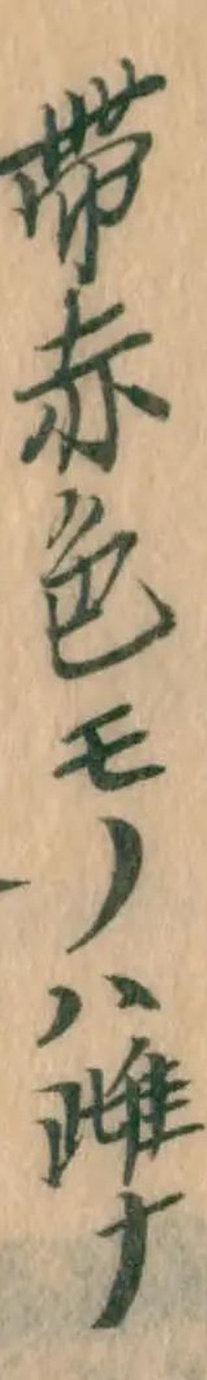帯赤色モノハ雌ナ
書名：千蟲譜 3巻. [2]
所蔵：国立国会図書館 National Diet Library, JAPAN
